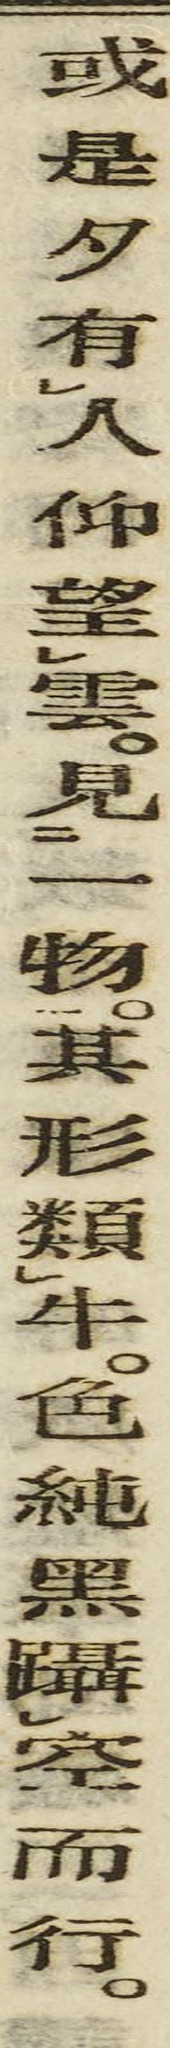或是夕有人仰望雲。見ニ一物。其形類牛。色純黒躡空而行。
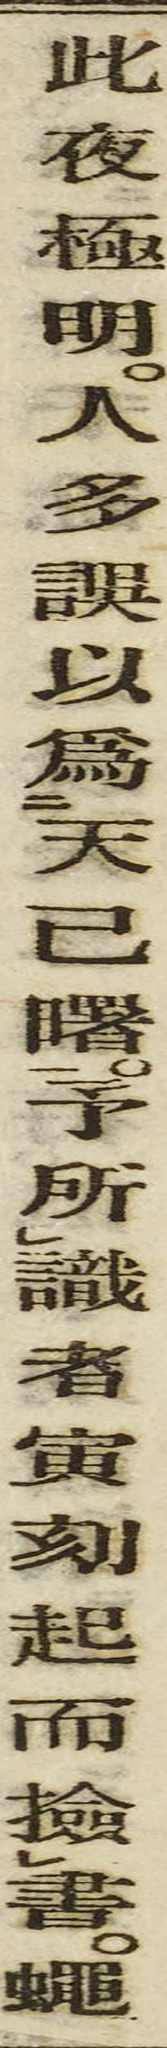此夜極明。人多誤以為ニ天已曙。予所識者寅刻起而撿書。蠅
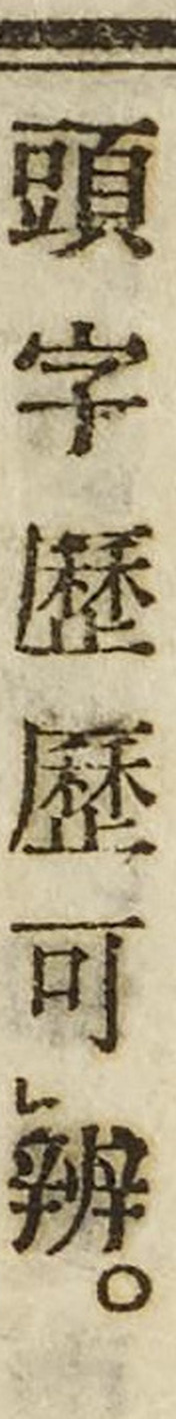頭字歴歴可弁。
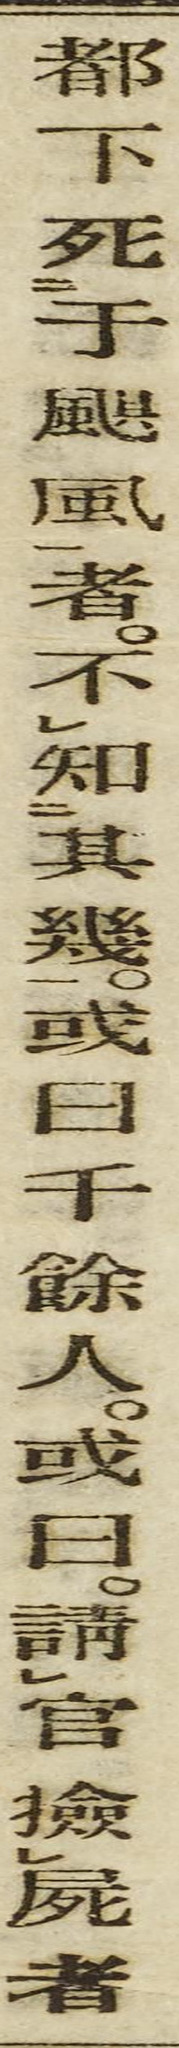都下死ニ于颱風者。不知ニ其幾。或曰千余人。或曰。請官撿屍者

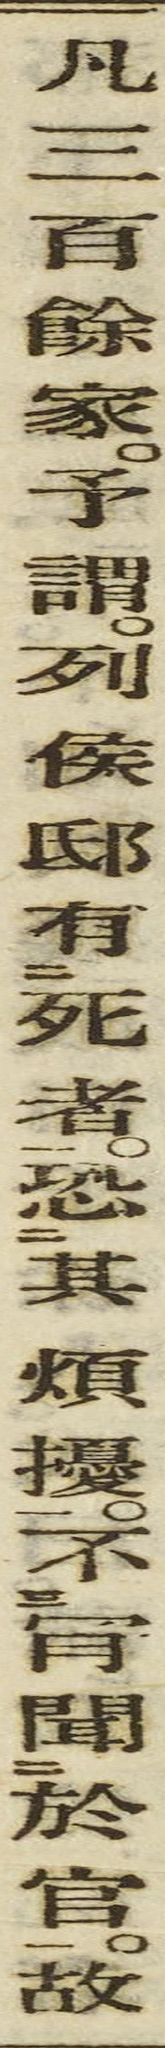凡三百余家。予謂。列侯邸有ニ死者。恐ニ其煩擾。不肎聞ニ於官。故
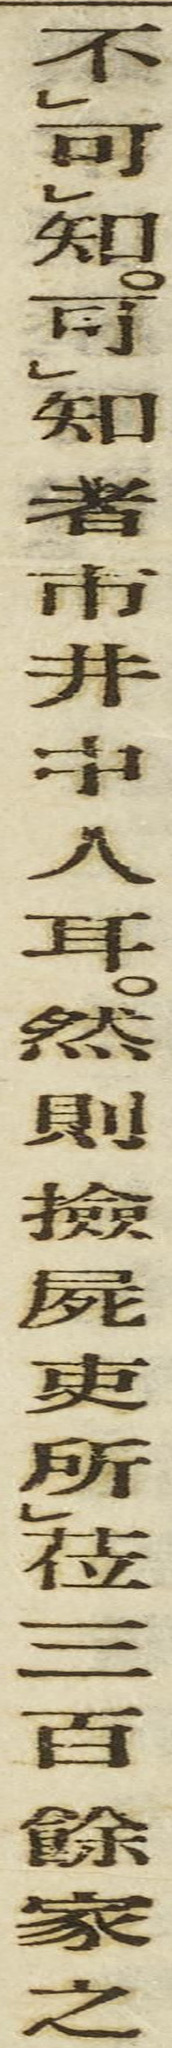不可知。可知者市井中人耳。然則撿屍吏所莅三百余家之
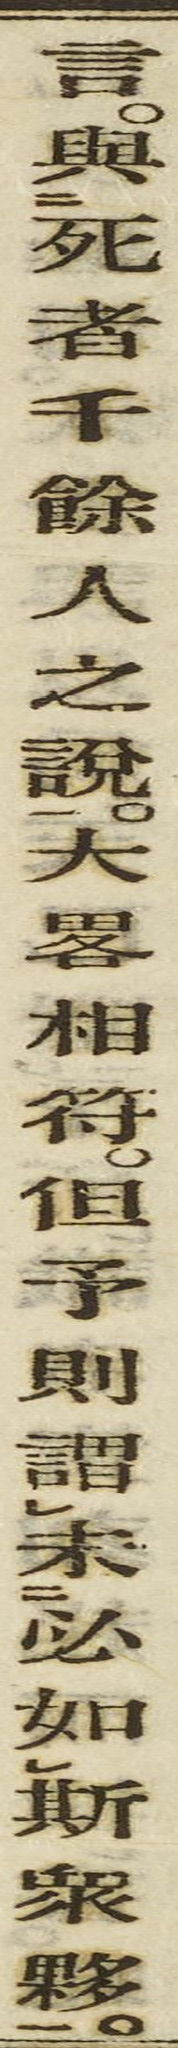言。与ニ死者千余人之説。大略相符。但予則謂未ニ必如斯衆夥。
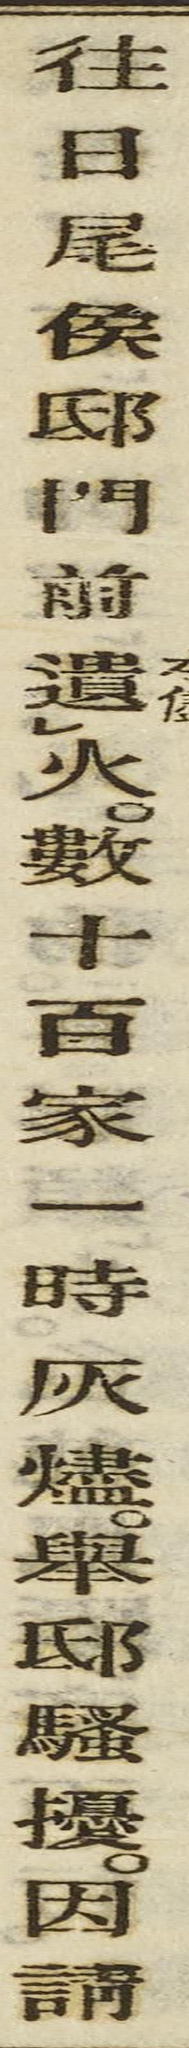往日尾侯邸門前遺火。数十百家一時灰燼。舉邸騒擾。因請
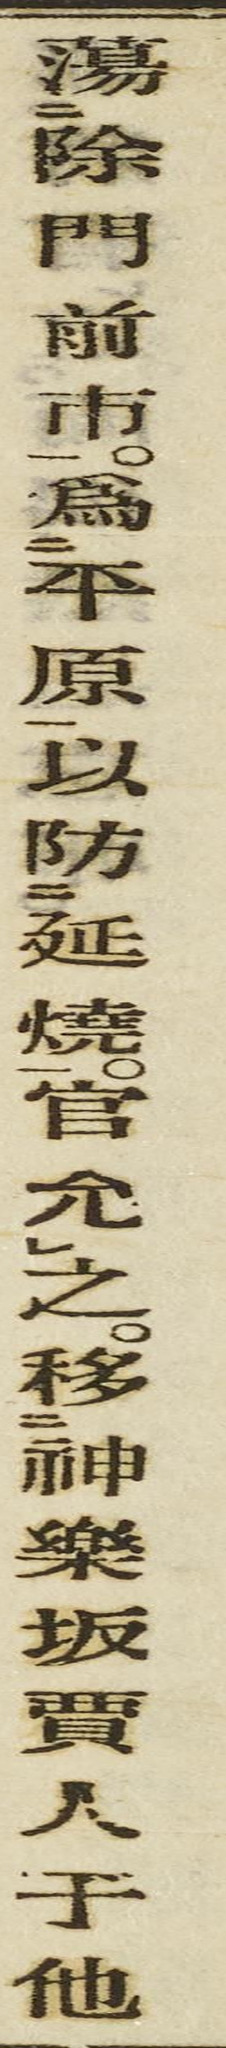蕩ニ除門前市。為ニ平原以防ニ延焼。官允之。移ニ神楽坂賈人于他
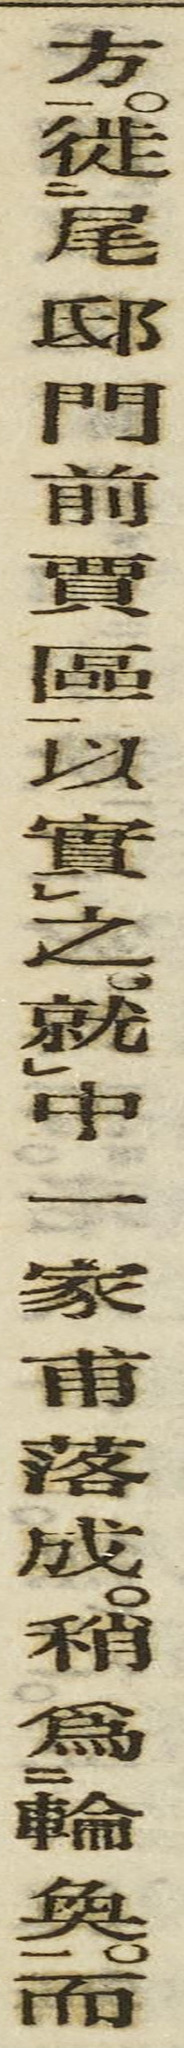方。徒ニ尾邸門前賈区以実之。就中一家甫落成。稍為ニ輪奐。而
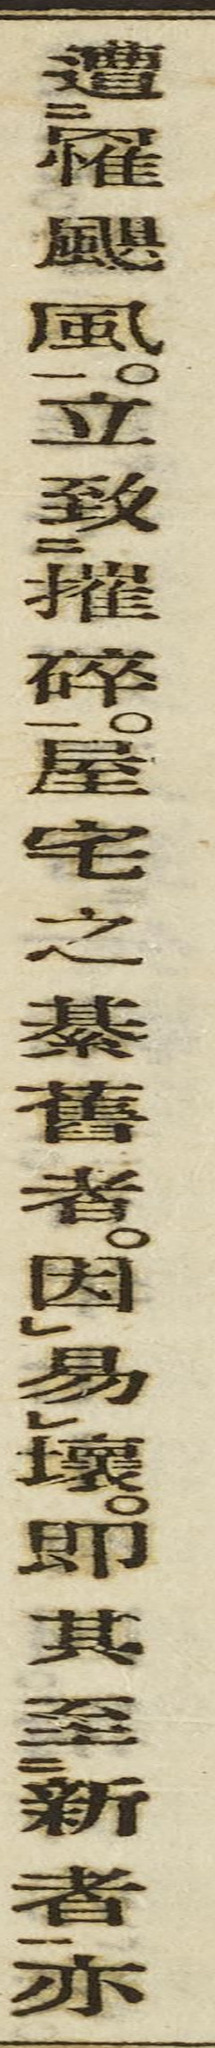遭ニ罹颱風。立致ニ摧砕。屋宅之綦旧者。因易壊。即其至ニ新者亦
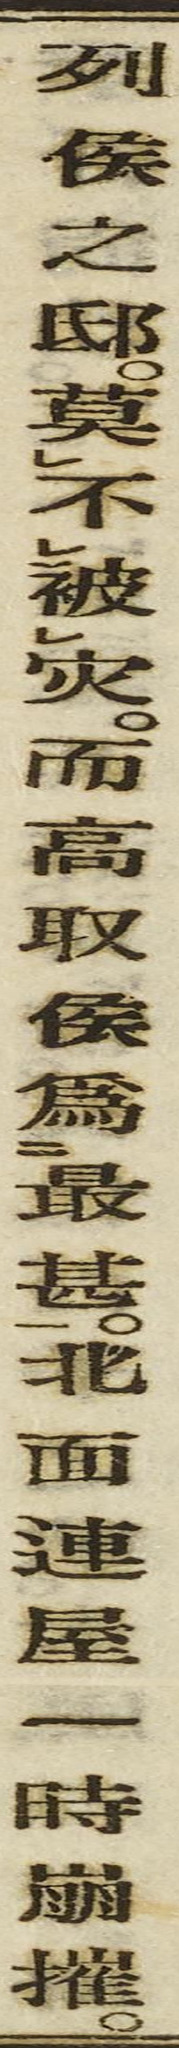列侯之邸。莫不破灾。而高取侯為ニ最甚。北面連屋一時崩摧。
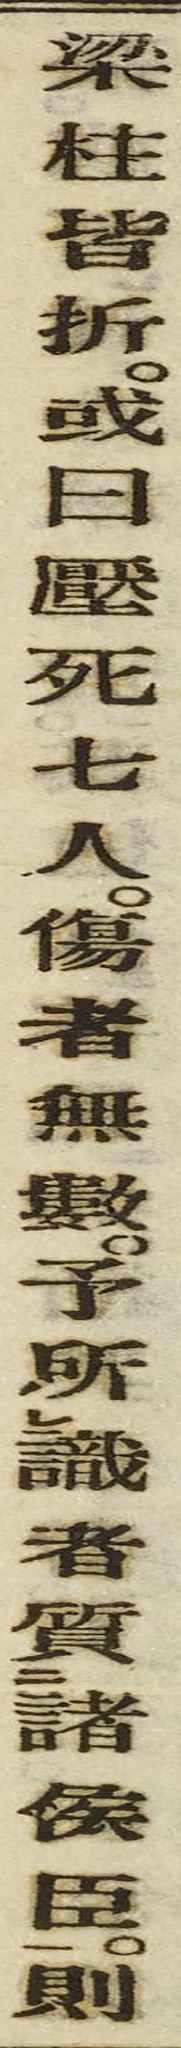梁柱皆折。或曰圧死七人。傷者無数。予所識者質ニ諸侯臣。則
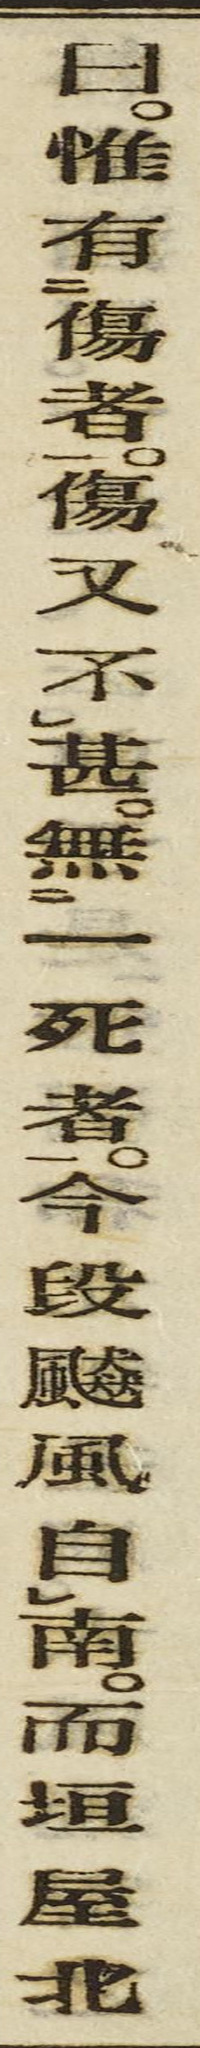曰。惟有ニ傷者。傷又不甚。無ニ一死者。今般颱風自南。而垣屋北
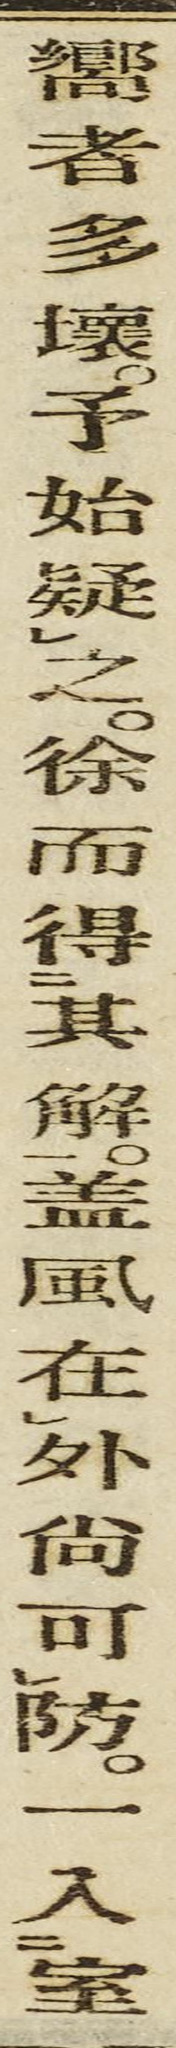嚮者多壊。予始疑之。徐而得ニ其解。盖風在外尚可防。一入ニ室
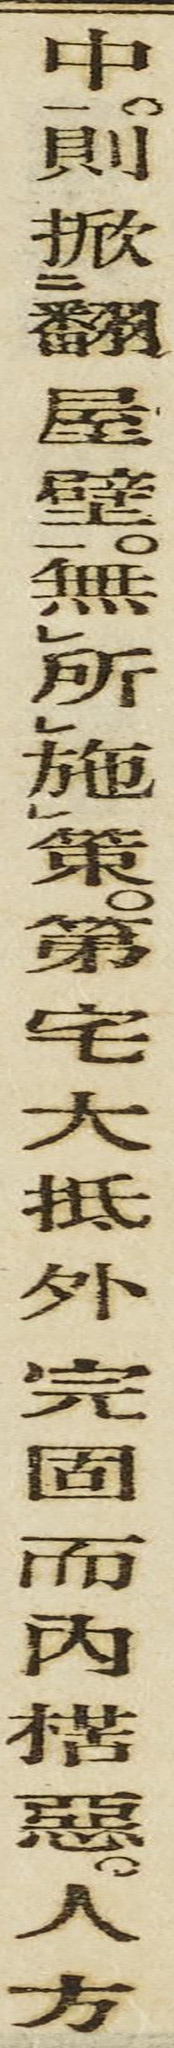中。則掀ニ翻屋壁。無所施策。第宅大抵外完固而内楛悪。人方
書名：史籍集覽　朝鮮陣古文・細井廣澤記・颶風紀事・天明七年將軍宣下次第書　全
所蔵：東京大学地震研究所図書室 Earthquake Research Institute Library, The University of Tokyo, JAPAN
